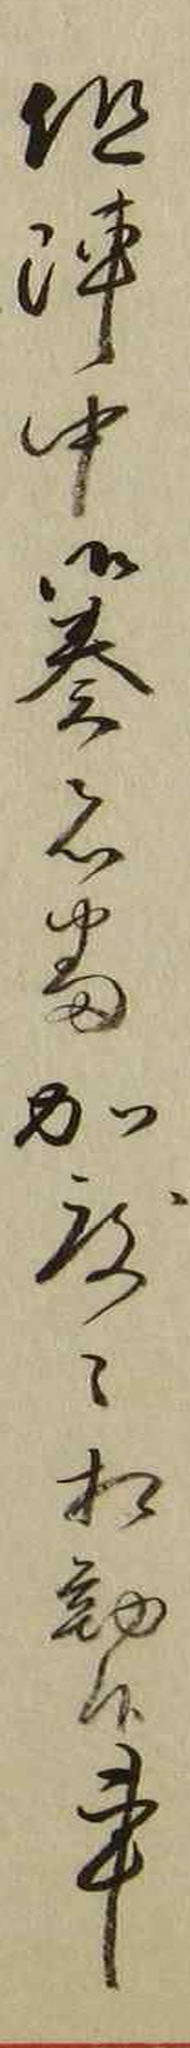但陣中御奏者番加度々相勤候事
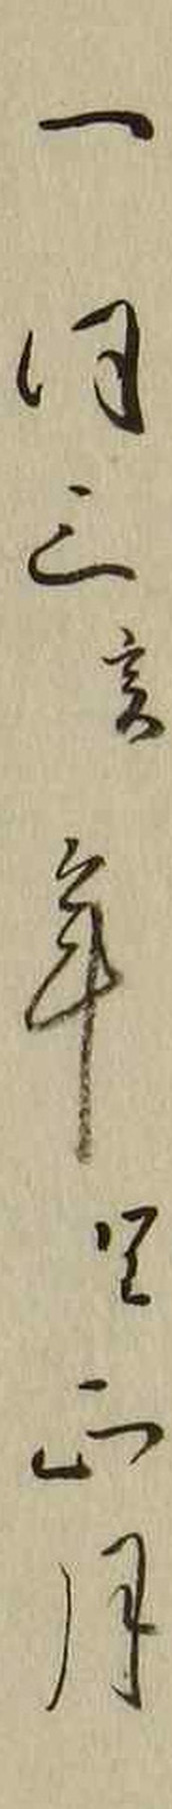一同三亥年閏正月
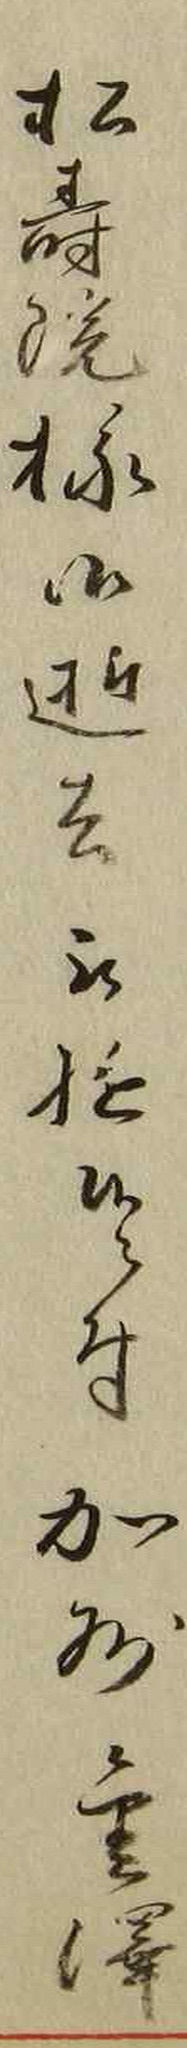松寿院様御逝去被遊候に付加州金沢
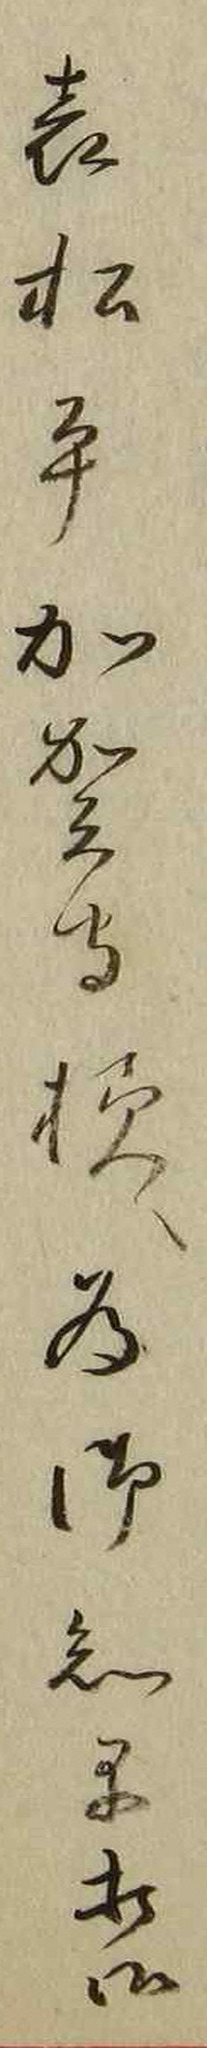表松平加賀守様へ為御知早打御
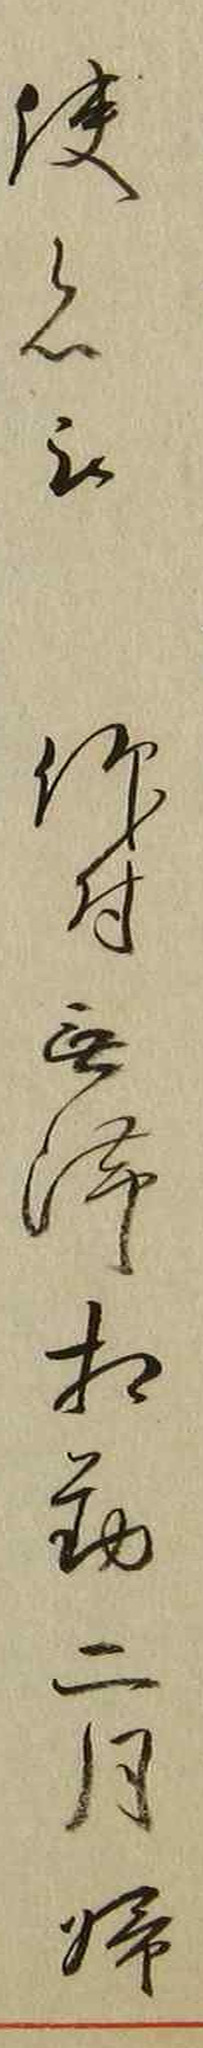使者被仰付無滞相勤二月帰
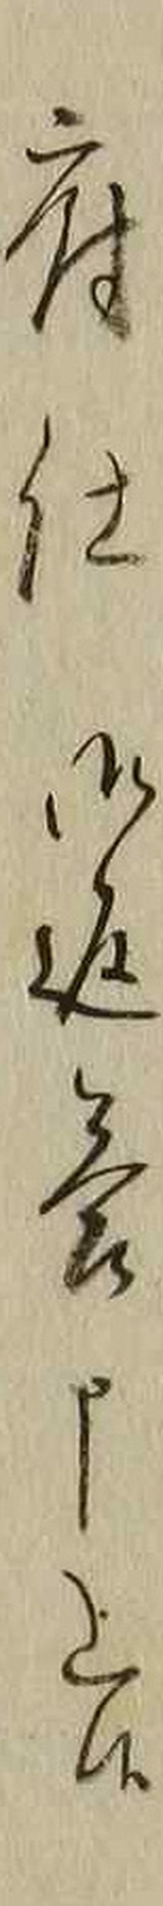府仕御返答申上候
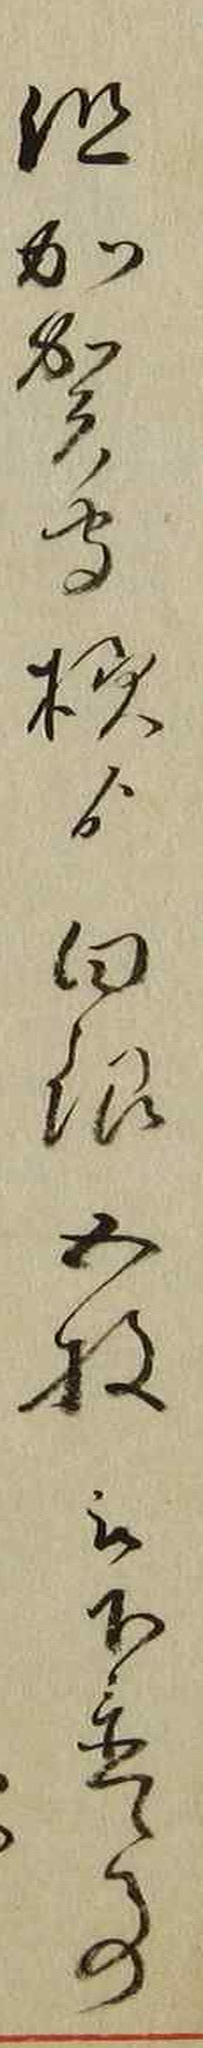但加賀守様より白銀五枚被下置候事
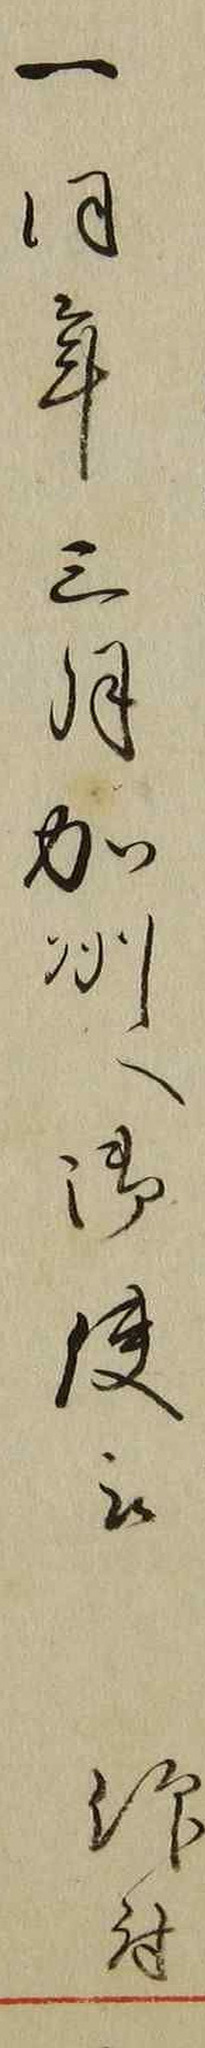一同年三月加州へ御使被仰付
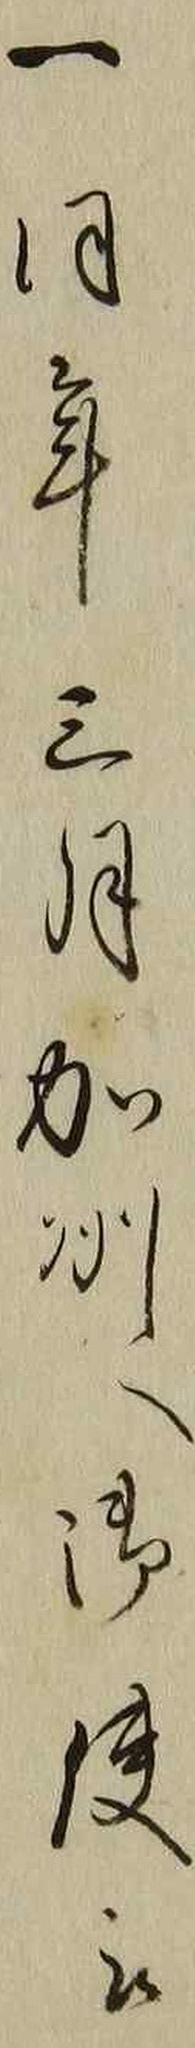一同年三月加州へ御使被仰付
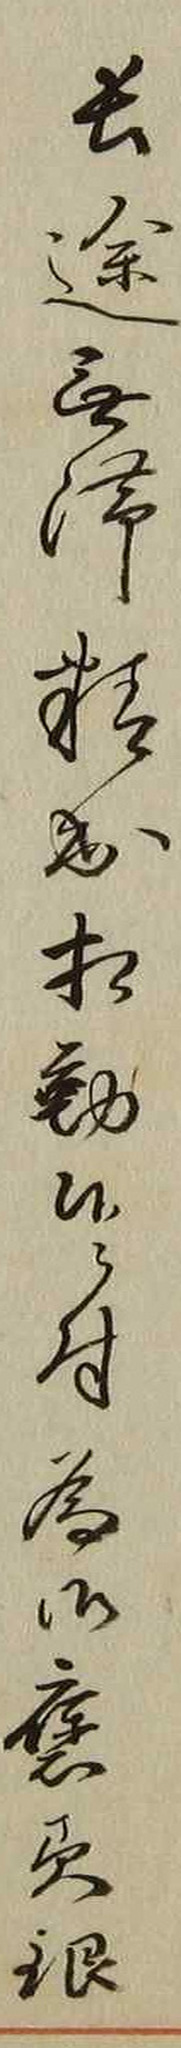長途無滞精出相勤候に付為御褒美銀
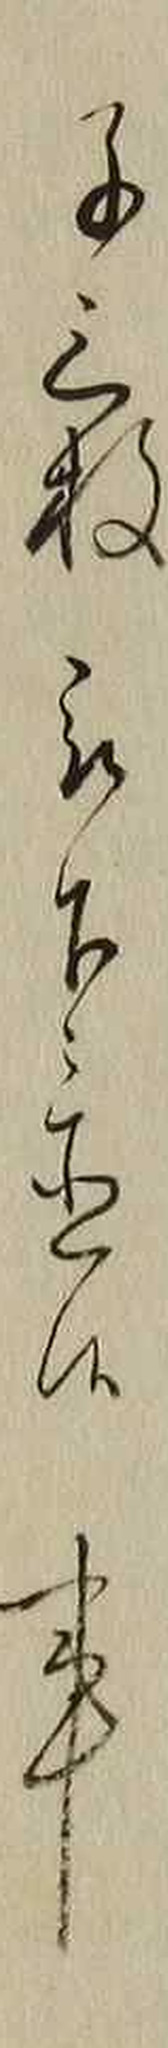子三枚被下置候事
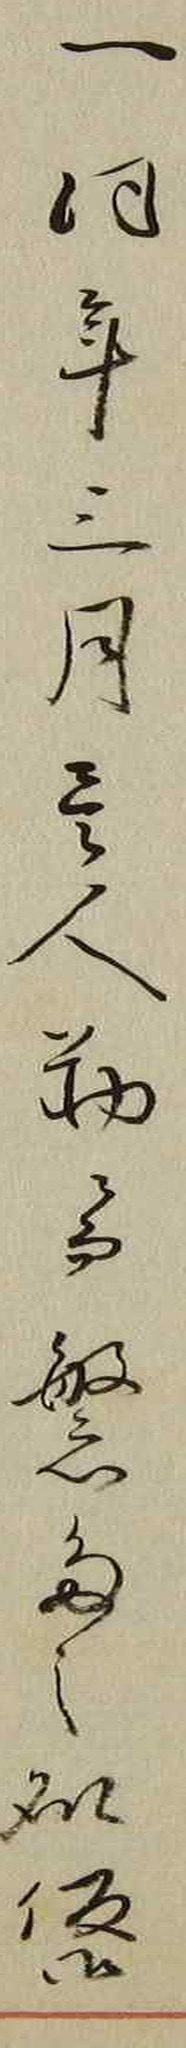一同年三月壱人勤にて繁多之処仮御
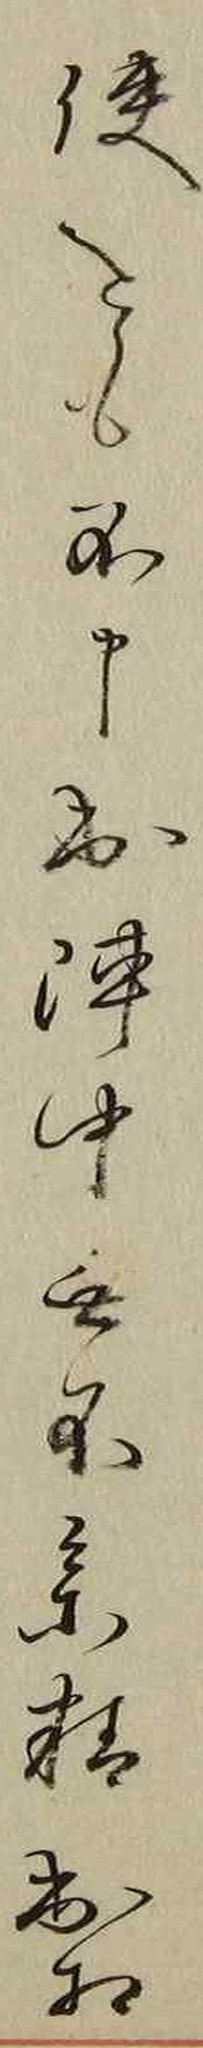使をも不申出陣中無不参精出相
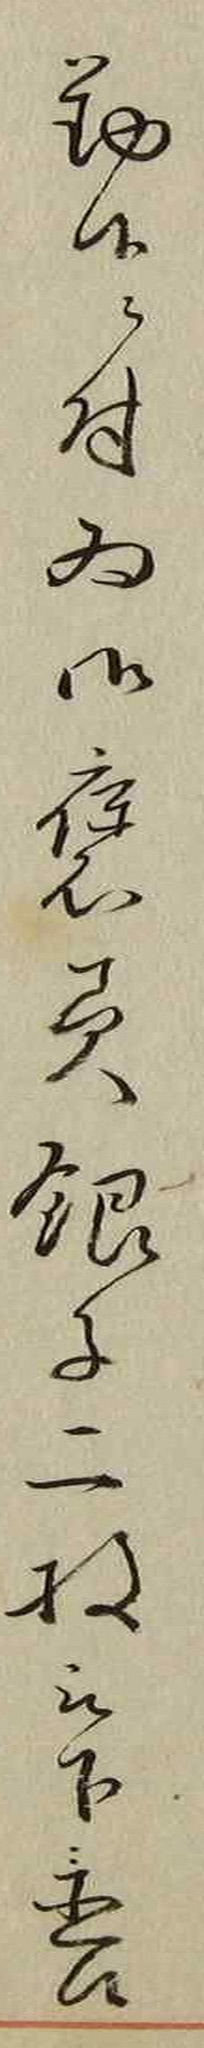勤候に付為御褒美銀子二枚被下置候
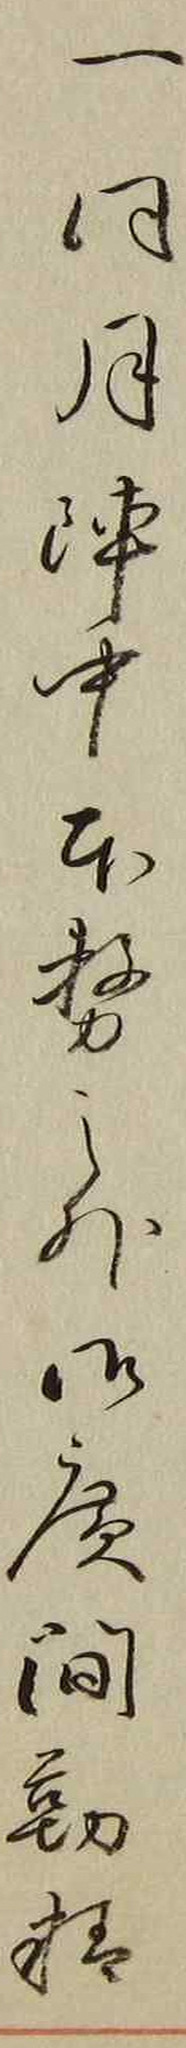一同月陣中本務之外御広間勤精
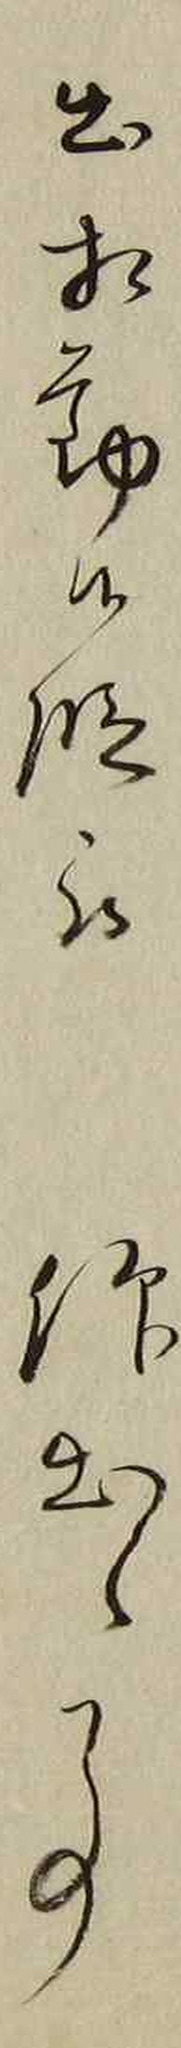出相勤候段被仰出候事
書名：諸士系譜　巻之1　い之部1
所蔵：会津若松市立会津図書館
